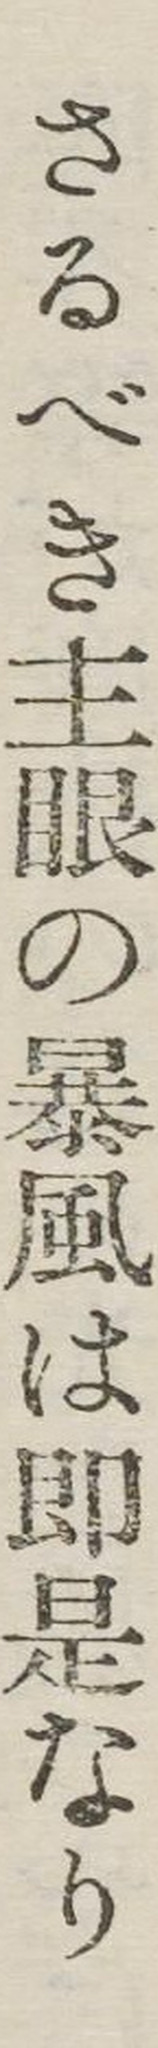さるべき主眼の暴風は即是なり
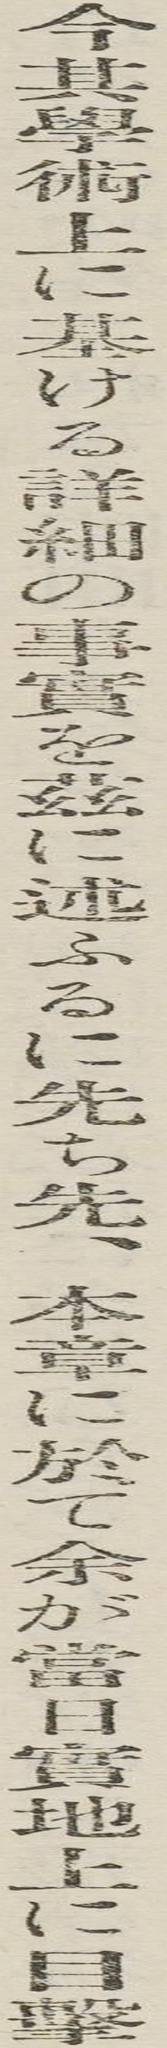今其学術上に基ける詳細の事実を茲に述ふるに先ち先、本章に於て余が当日実地上に目撃
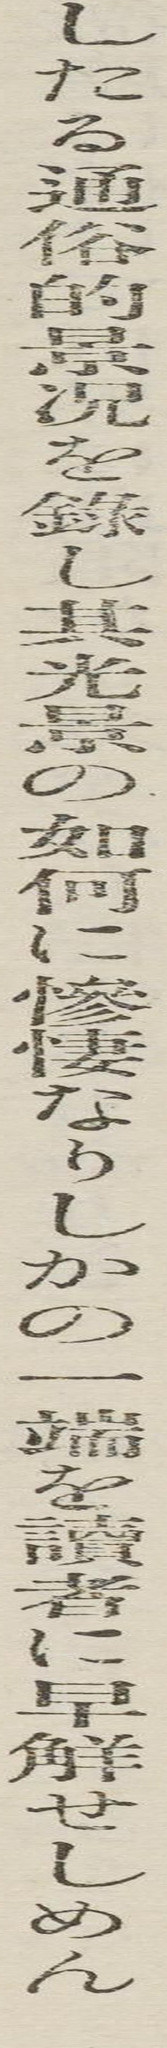したる通俗的景況を録し其光景の如何に惨悽なりしかの一端を読者に早觧せしめん
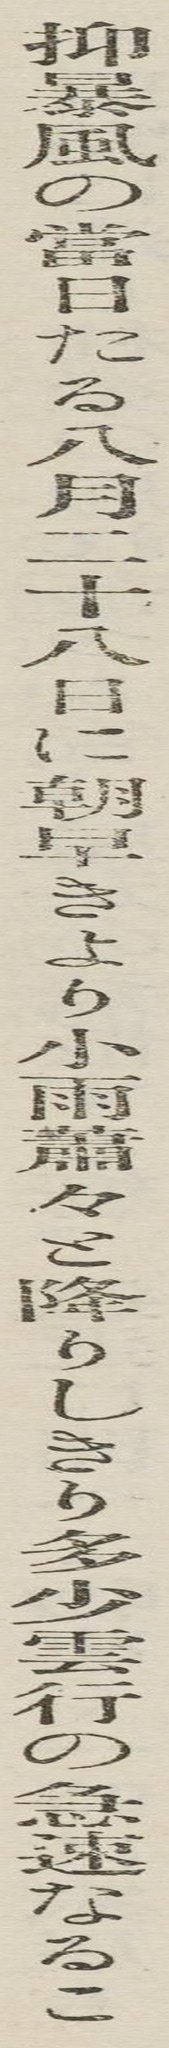抑暴風の当日たる八月二十八日の朝早きより小雨粛々と降りしきり多少雲行の急速なるこ
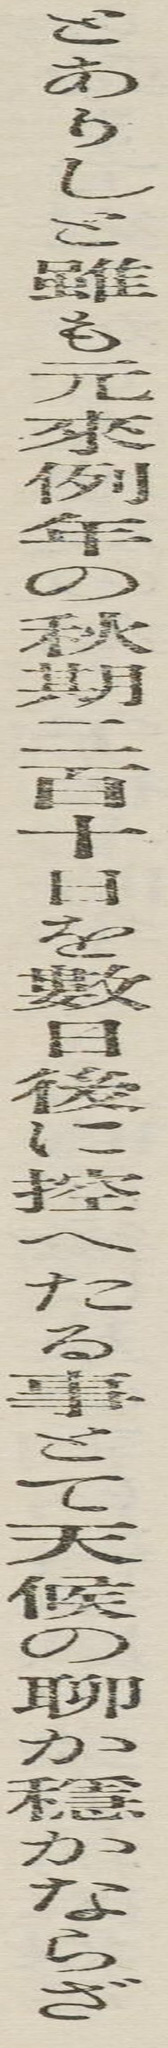とありしと雖も元来例年の秋季二百十日を数日後に控へたる事とて天候の聊か穏かならざ
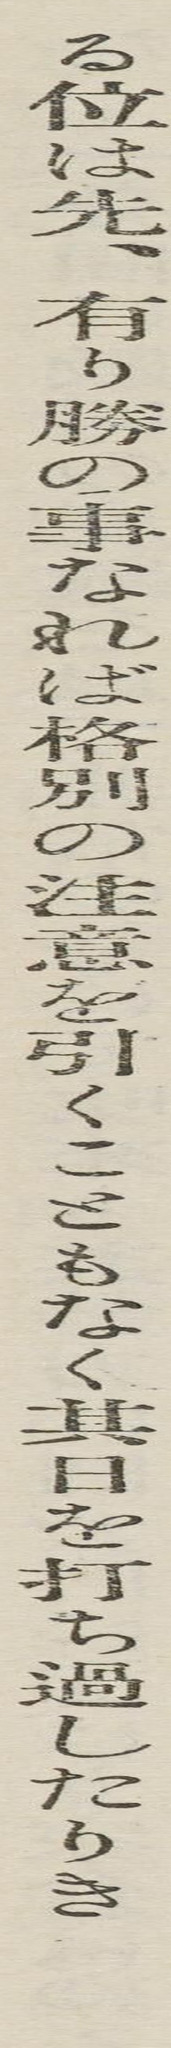る位は先、有り勝の事なれば格別の注意を引くこともなく其日を打ち過したりき
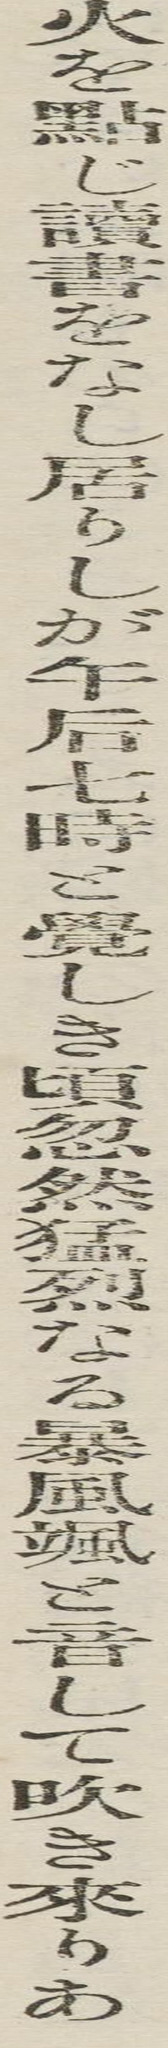火を点じ読書をなし居りしが午后七時と覚しき頃忽然猛烈なる暴風颯と音して吹き来りあ

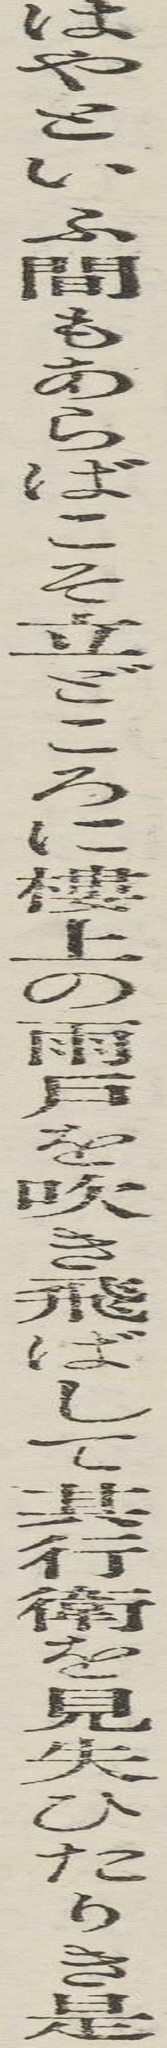はやといふ間もあらばこそ立ちどころに楼上の雨戸を吹き飛ばして其行衛を見失ひたりき是
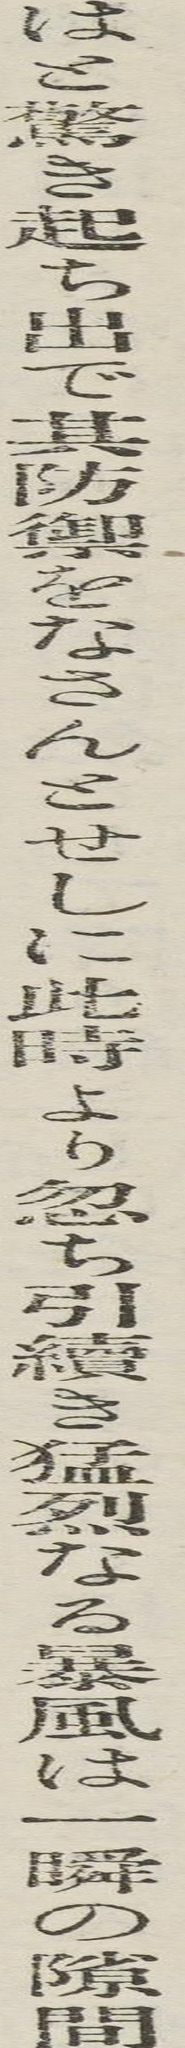はと驚き起ち出で其防禦をなさせんとしに此時より忽ち引続き猛烈なる防風は一瞬の隙間
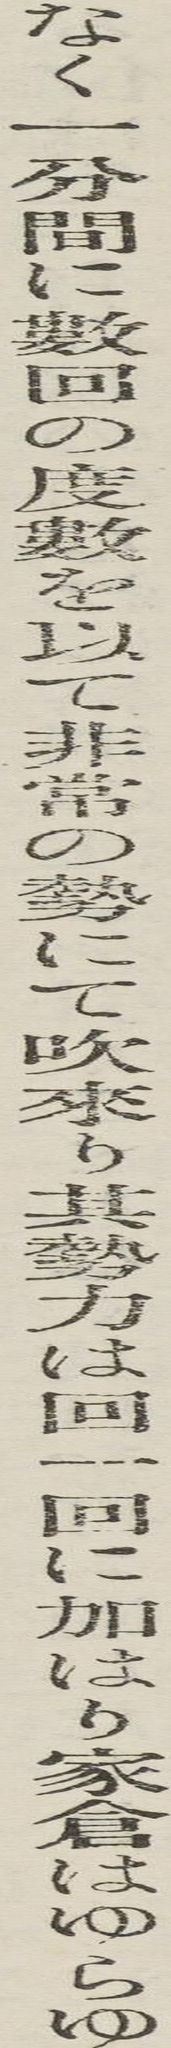なく一分間に数回の度数を以て非常の勢にて吹来り其勢力は回一回に加はり家倉はゆらゆ
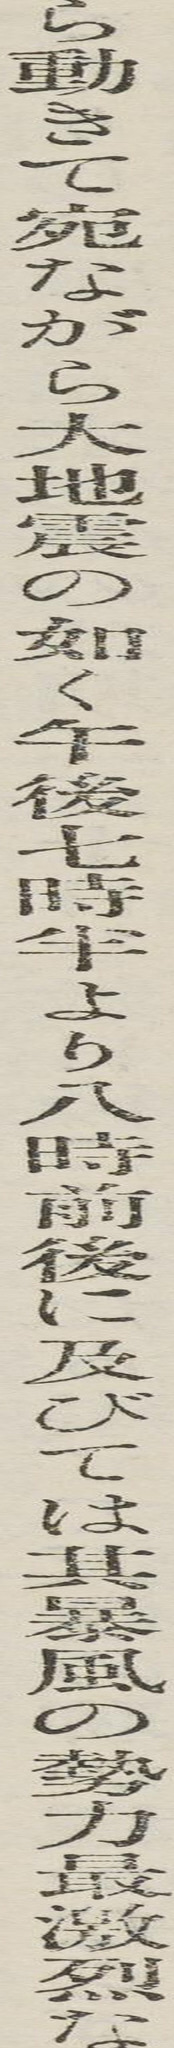ら動きて宛ながら大地震の如く午後七時半より八時前後に及びては其暴風の勢力最激烈な
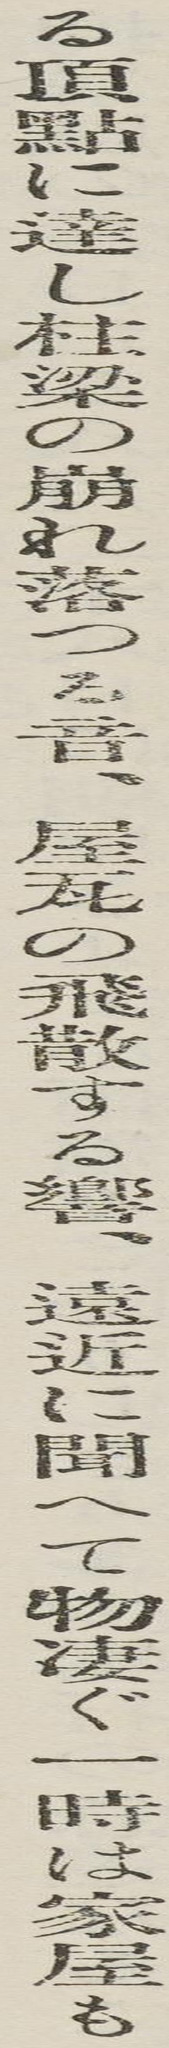る頂点に達し柱梁の崩れ落つる音、屋瓦の飛散する響、遠近に聞へて物凄ぐ一時は家屋も
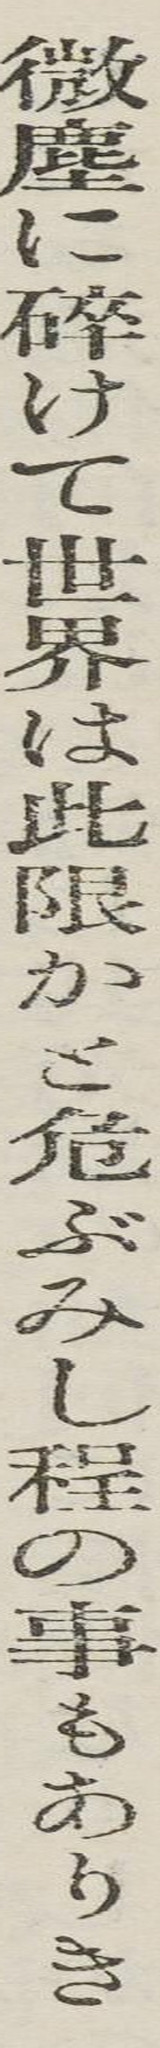微塵に砕けて世界は此限かと危ぶみし程の事もありき
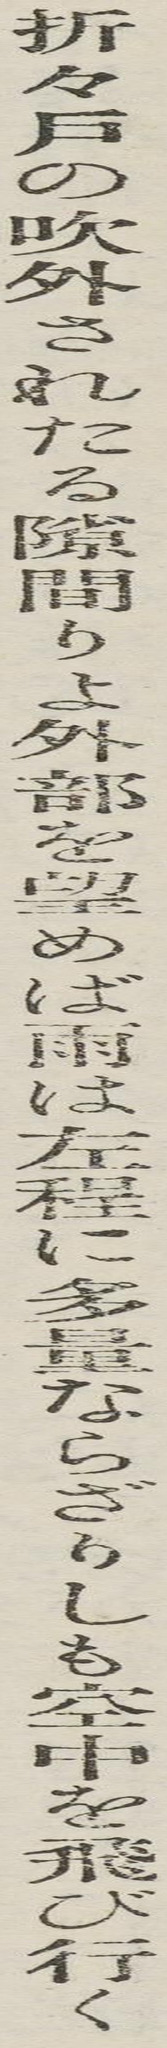折々戸の吹外されたる隙間りよ外部を望めば雨は左程に多量ならざりしも空中を飛び行く
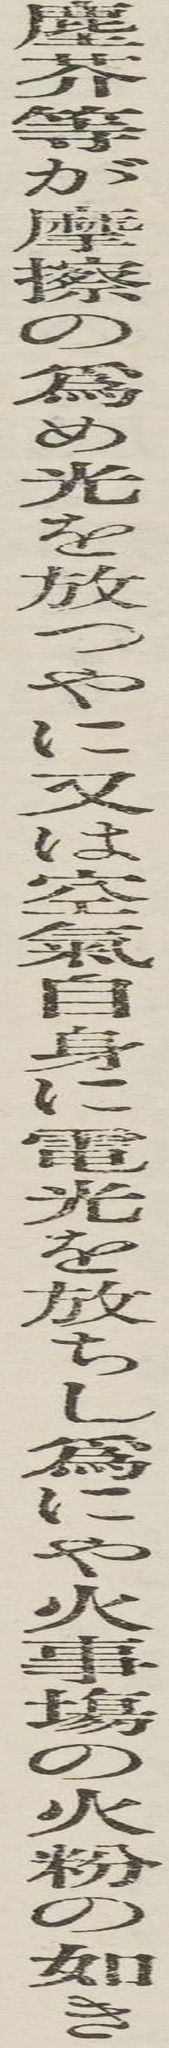塵芥等が摩擦の為め光を放つやに又は空気自身に電光を放ちし為にや火事場の火粉の如き
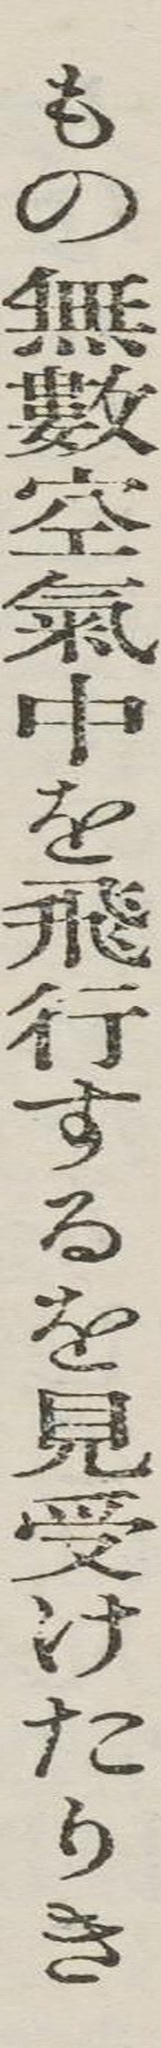もの無数空気中を飛行するを見受けたりき
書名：土佐古今ノ地震
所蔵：東京大学地震研究所図書室 Earthquake Research Institute Library, The University of Tokyo, JAPAN
